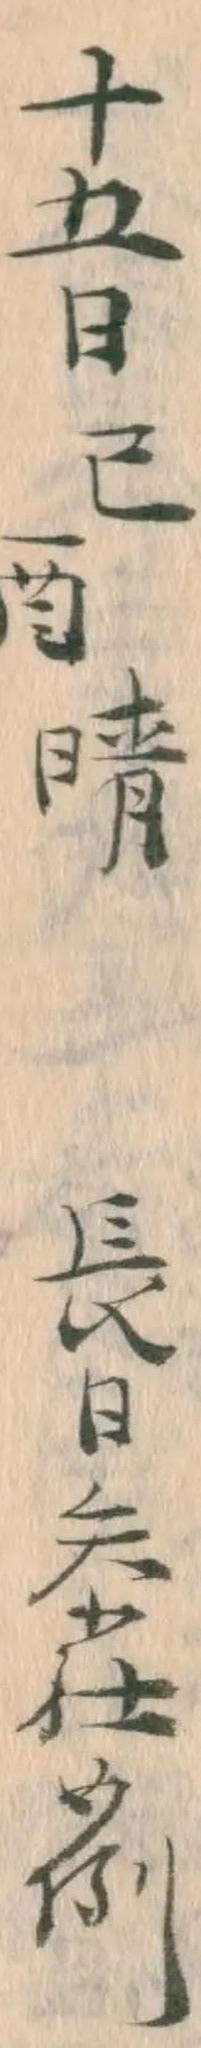十五日己酉晴参社如例
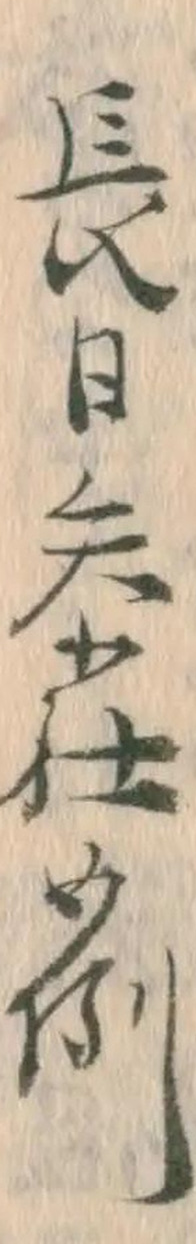一長日参社如例
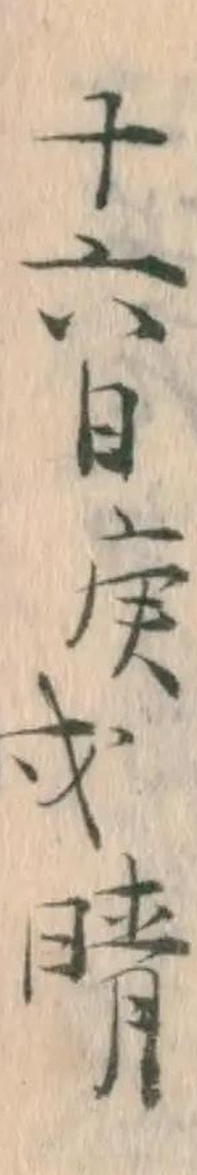十六日庚戌晴
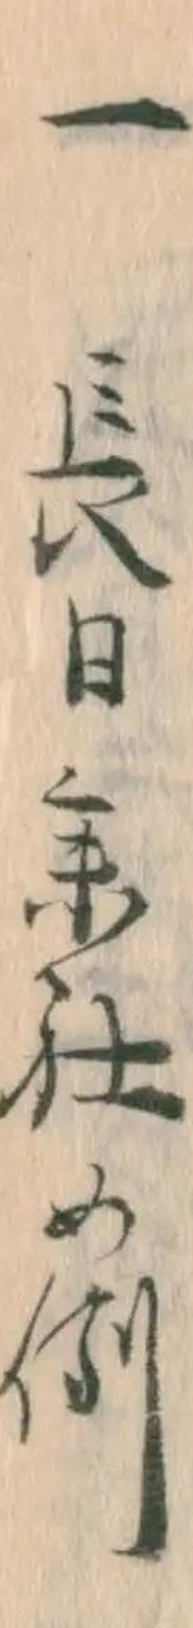一長日参社如例
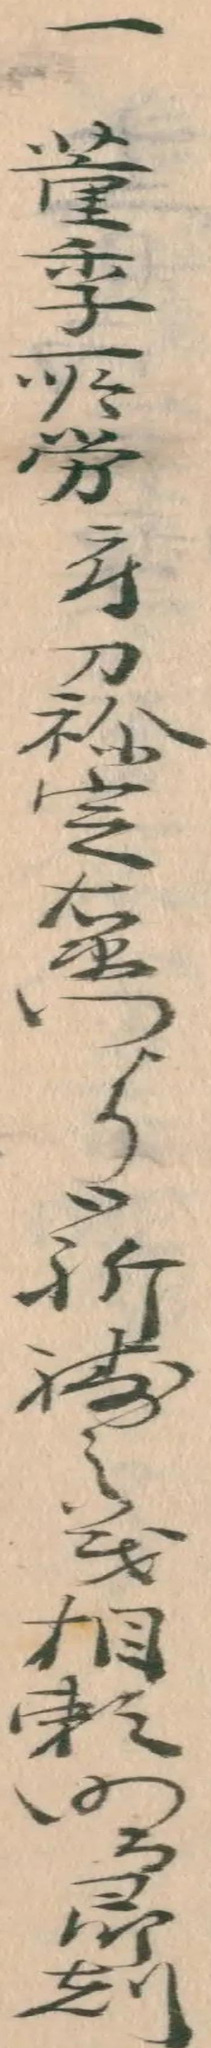一董季所労ニ付刀祢定右衛門より御祈祷之義相頼仍而即刻
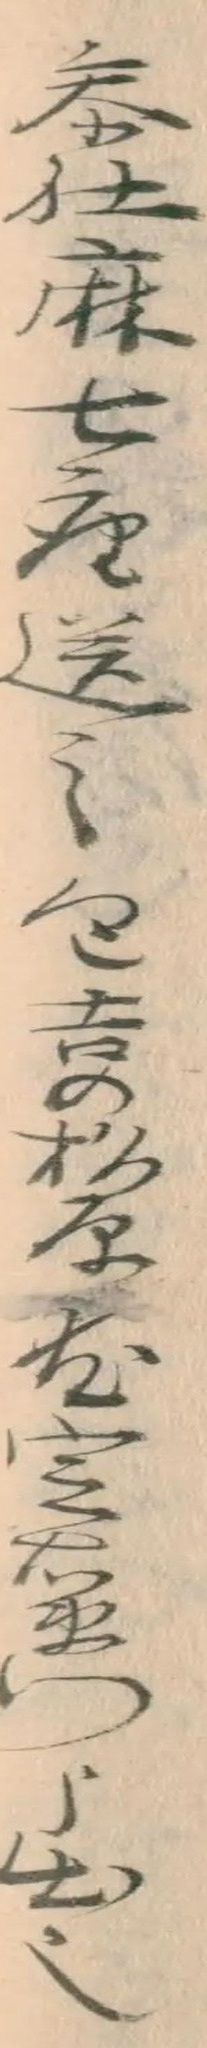参仕麻七座送之包吉の松原尤定右衛門申出也
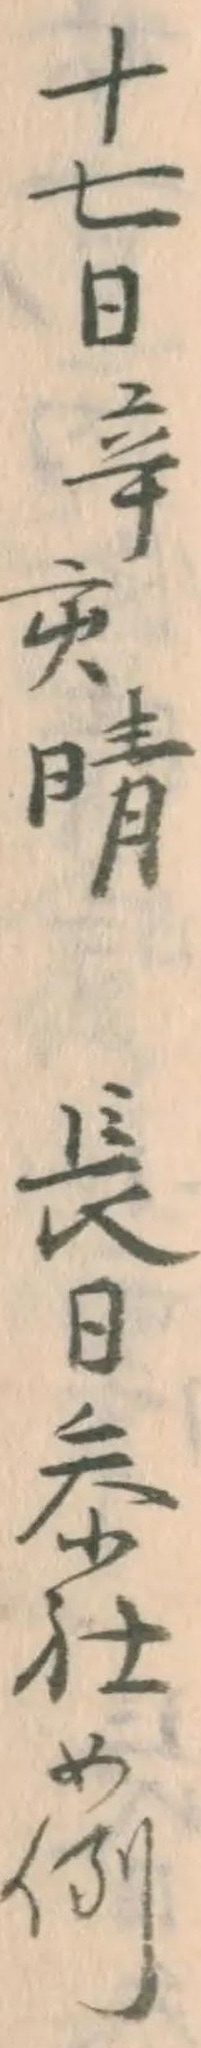十七日辛亥晴長日参社如例
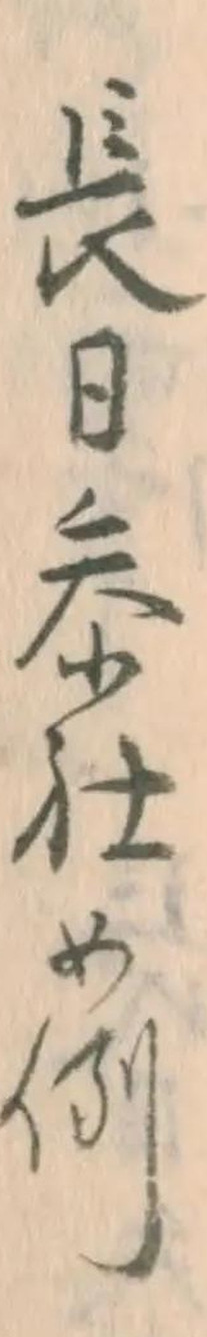一長日参社如例
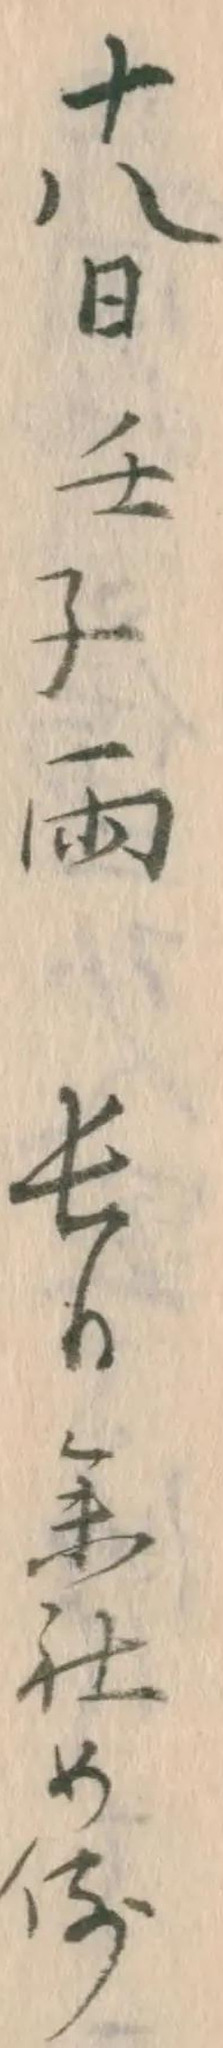十八日壬子雨長日参社如例
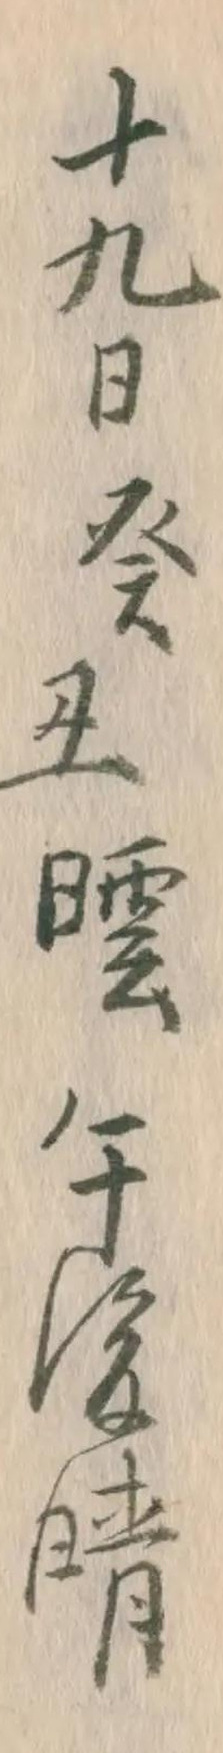十九日癸丑曇午後晴
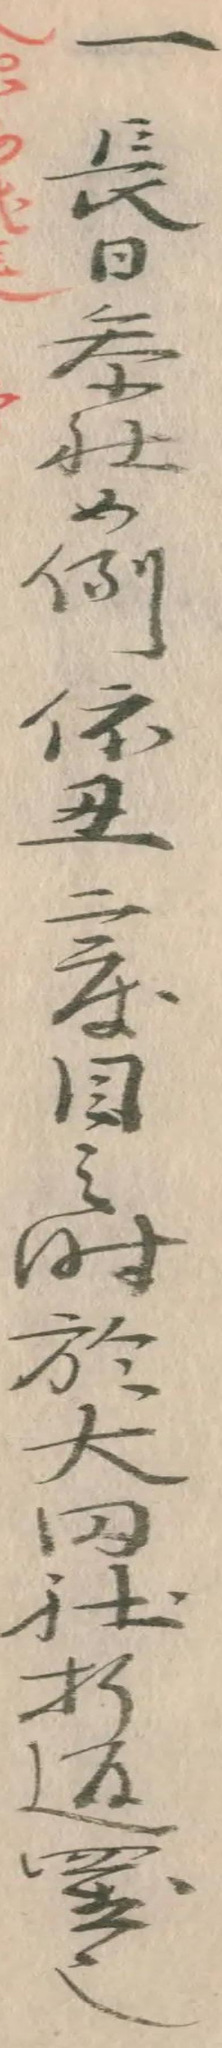一長日参社如例依丑二度目之時於大田社折返置也
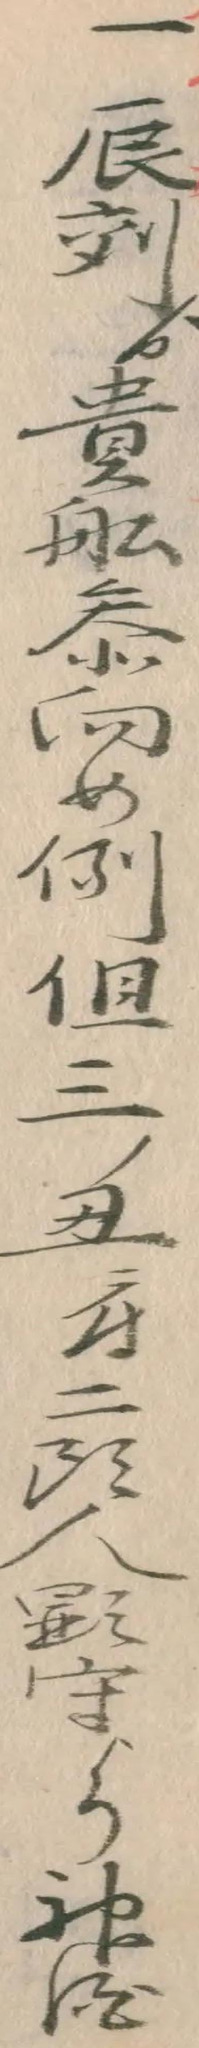一辰刻ゟ貴舩参向如例但三ノ丑ニ付二頭人顕守より神酒
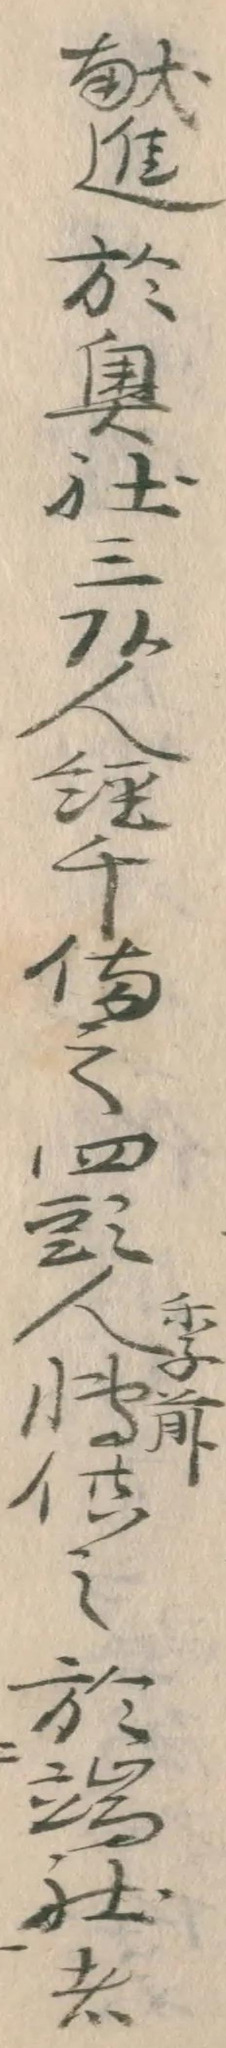献進於奥社三頭人経千備之四頭人季前轉供之於端社は
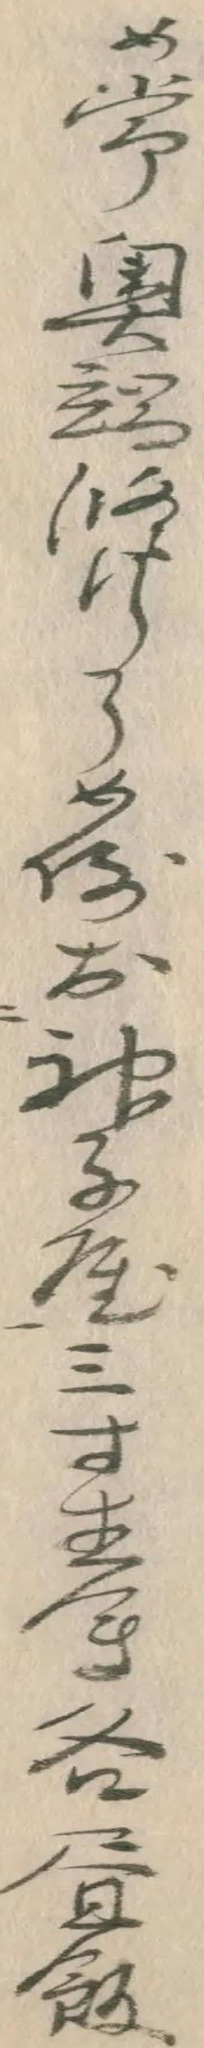如常奥端修行了如例於神子屋三寸直會各昼飯
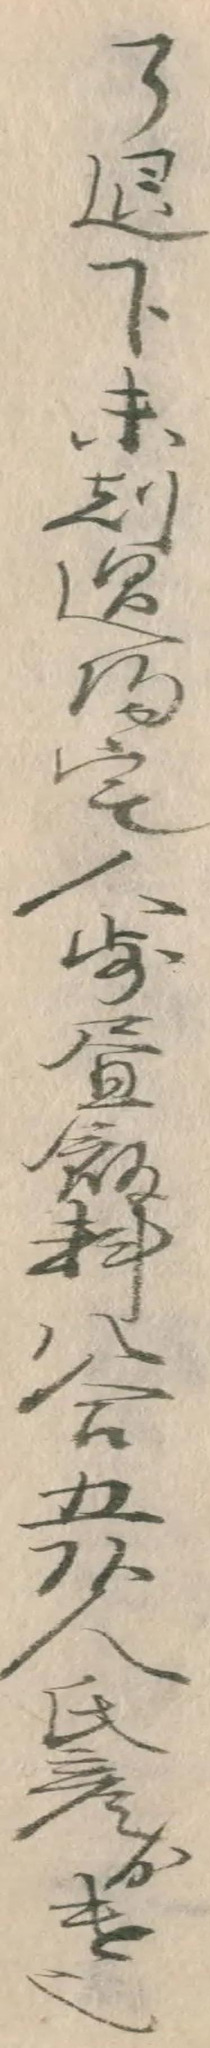了退下未刻過帰宅人歩昼飯料八合五頭人氏彦ゟ遣也
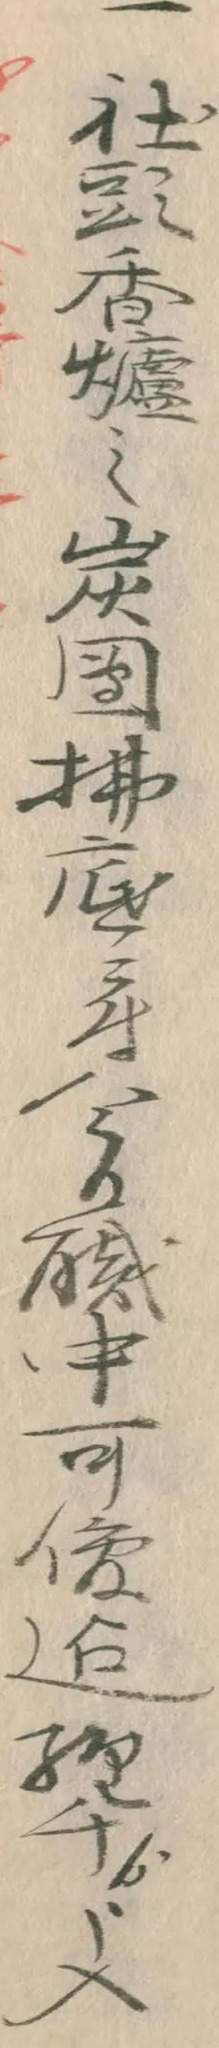一社頭香爐之炭團払底ニ付今日職中可俊迄経千ゟ申入
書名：賀茂社記録. 第72冊
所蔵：国立国会図書館 National Diet Library, JAPAN
